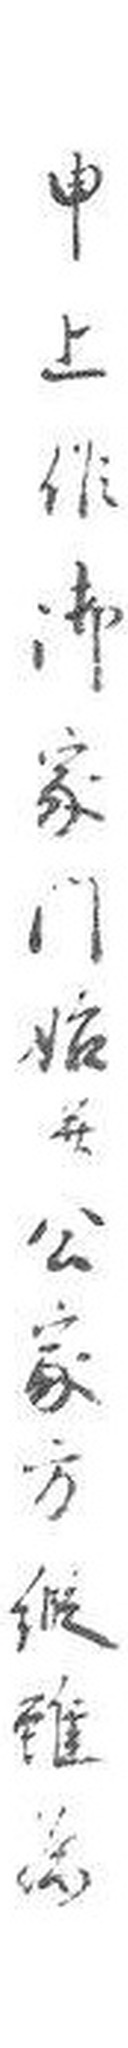申上候御家門始幷公家方縦誰為
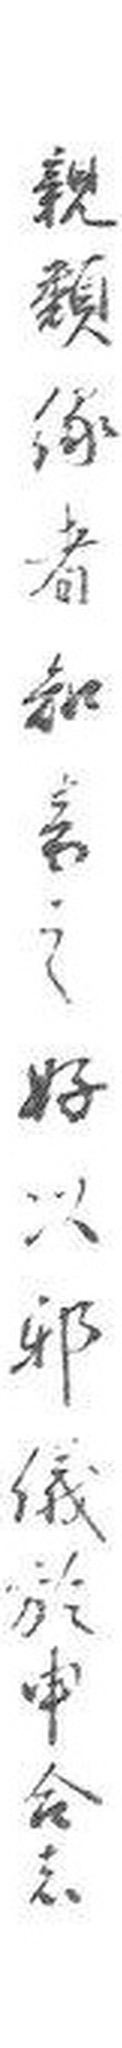親類縁者知音之好以邪儀於申合者
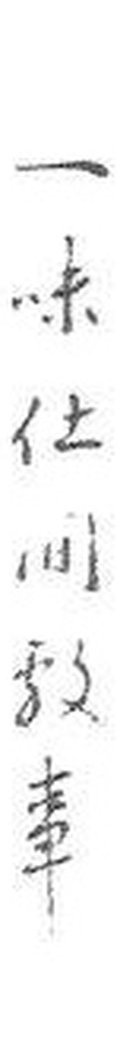一味仕間敷事
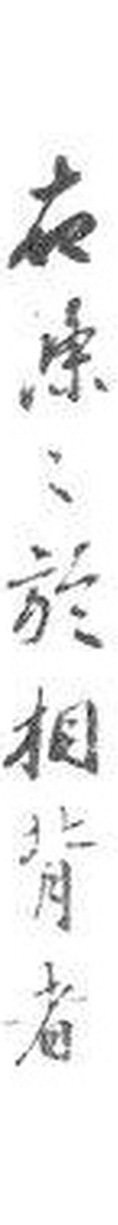右條々於相背者
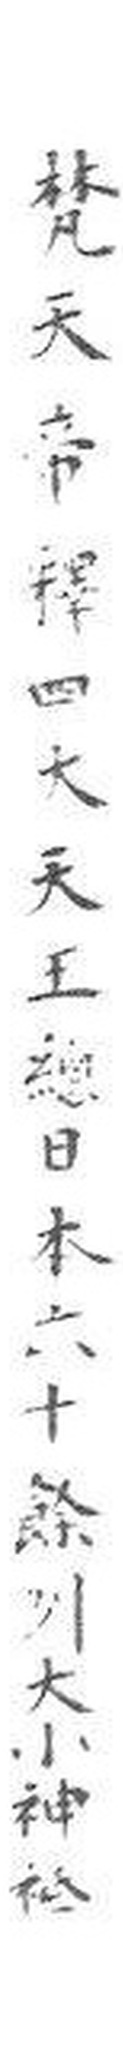梵天帝釈四大天王総日本六十余州大小神祇
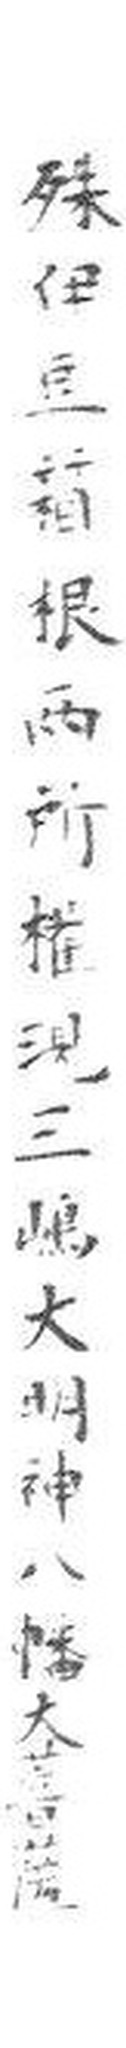殊伊豆箱根両所権現三島大明神八幡大菩薩
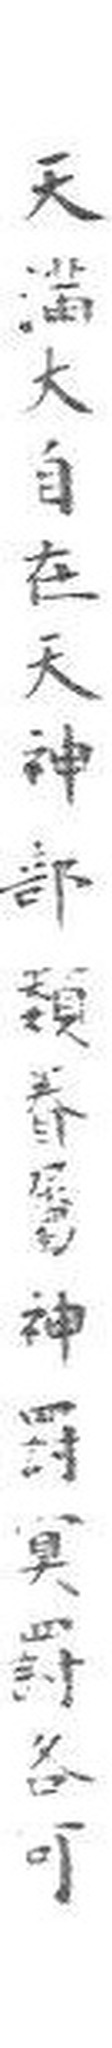天満大自在天神部類眷属神罰冥罰各可
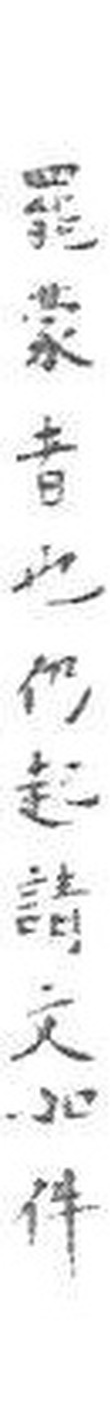罷蒙者也仍起請文如件
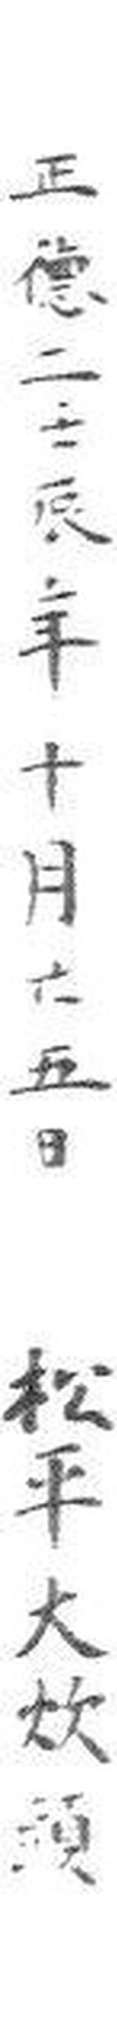正徳二壬辰年十月廿五日松平大炊頭
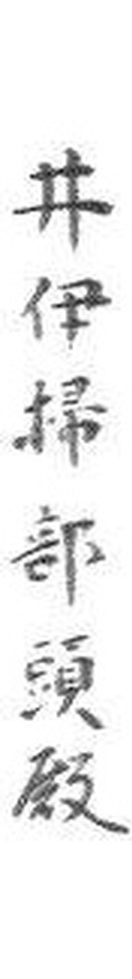井伊掃部頭殿
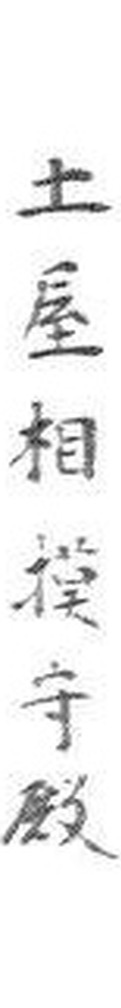土屋相模守殿
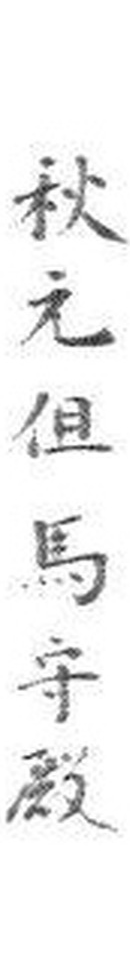秋元但馬守殿
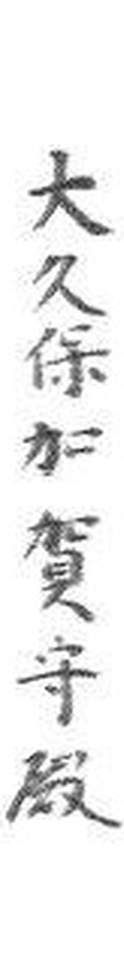大久保加賀守殿
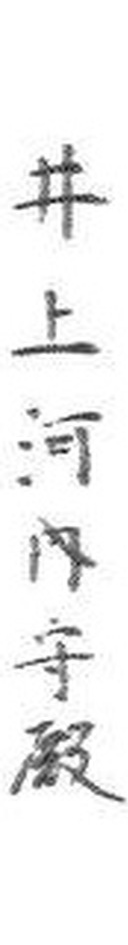井上河内守殿
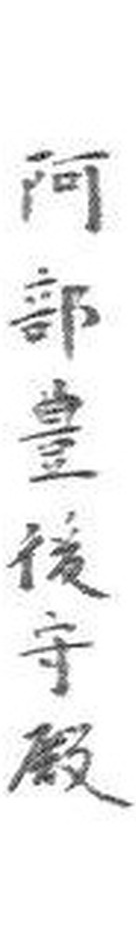阿部豊後守殿

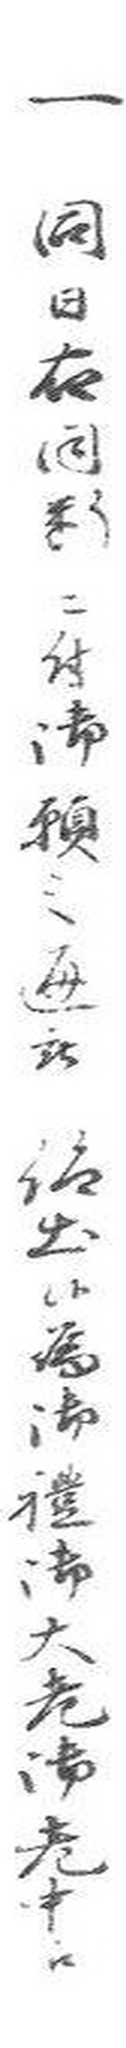一同日右同断ニ付御願之通被仰出候為御礼御大老御老中江
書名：家譜 二十九 吉邦公 従正徳二年到正徳三年
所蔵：福井県文書館 Fukui Prefectural Archives
